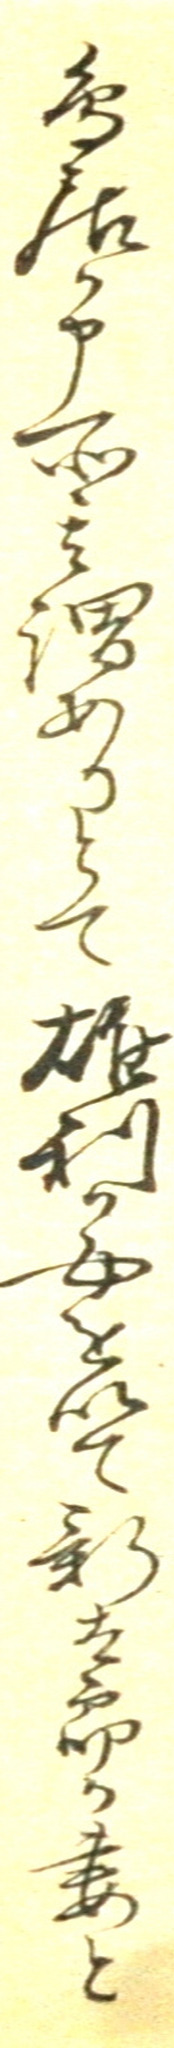鳥居の申所其謂ありとて雄利か女を以て新太郎か妻と
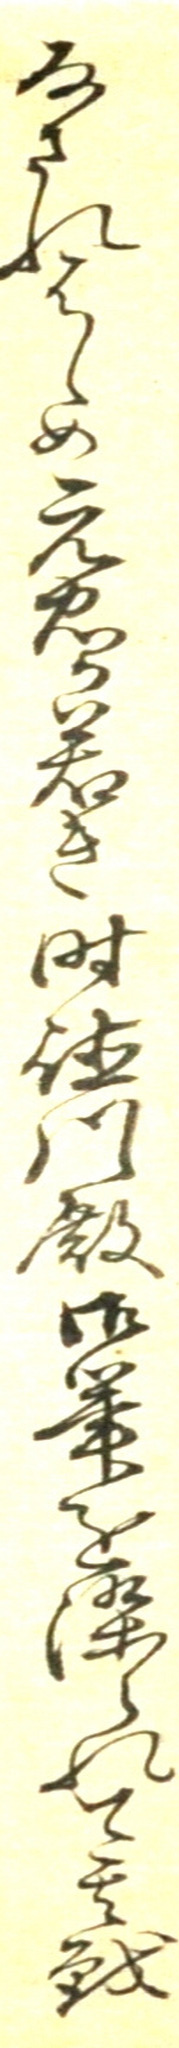なされはしめ元忠か若き時徳川殿御筆を染られて其戦
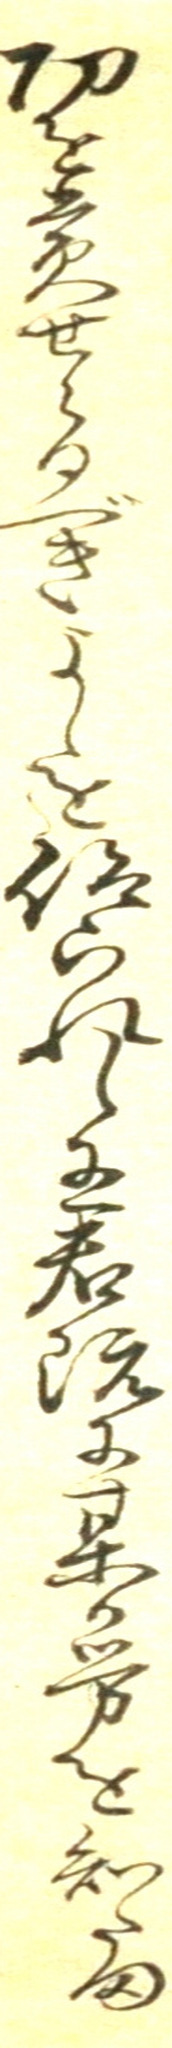功を賞せらるべきよしを仰られしに君既に某か労を知たま
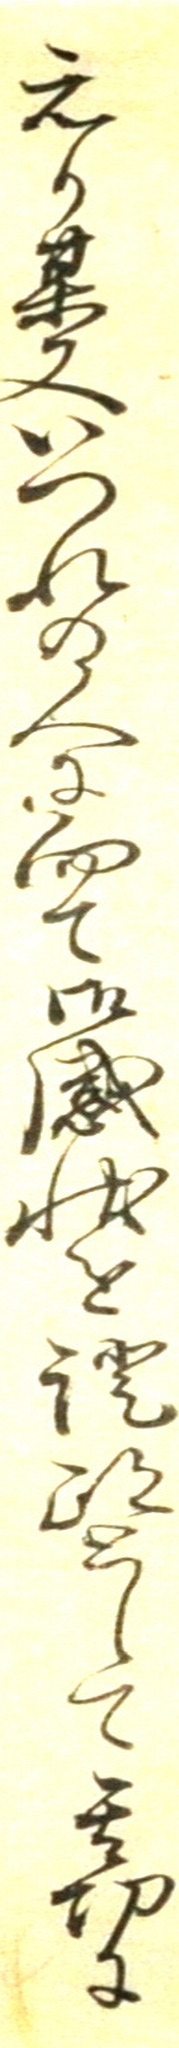えり某又いつれの人に向て御感状を証跡として其功に
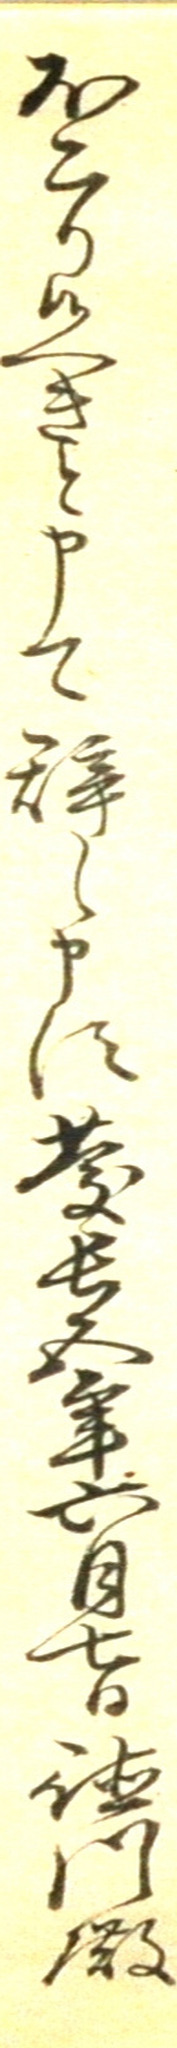ほこり候へきと申て辞し申す慶長五年六月七日徳川殿
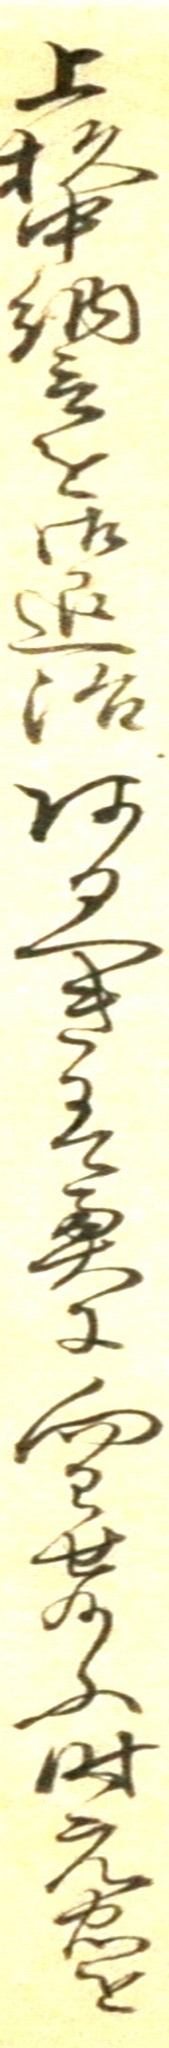上杉中納言を御退治あるへきにて奥に向わせ給ふ時元忠を
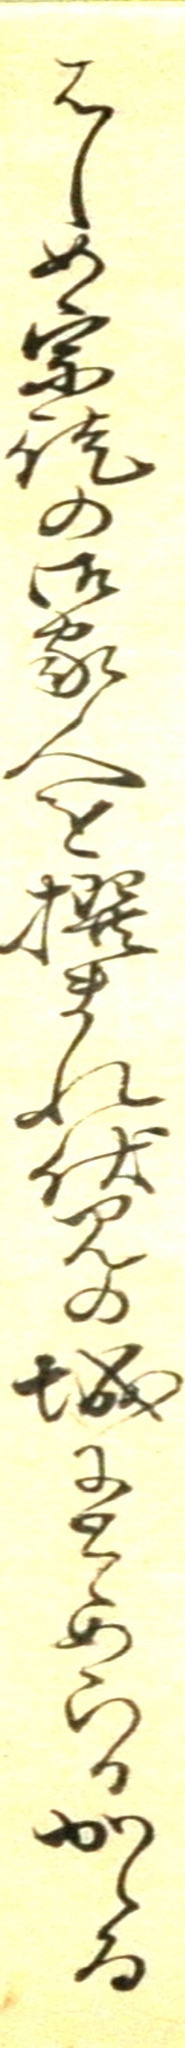はしめ宗徒の御家人を撰まれ伏見の城にとゝめらるかゝる
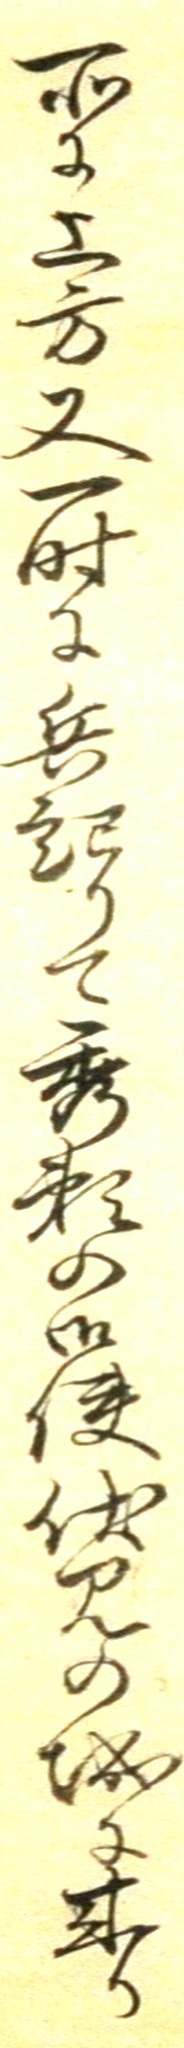所に上方又一時に兵起りて秀頼の御使伏見の城に来り
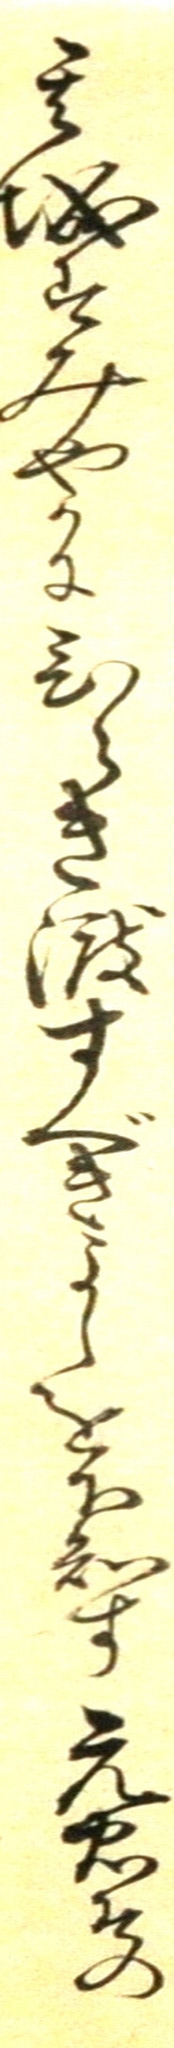其城すみやかにひらき渡すべきよしを下知す元忠その
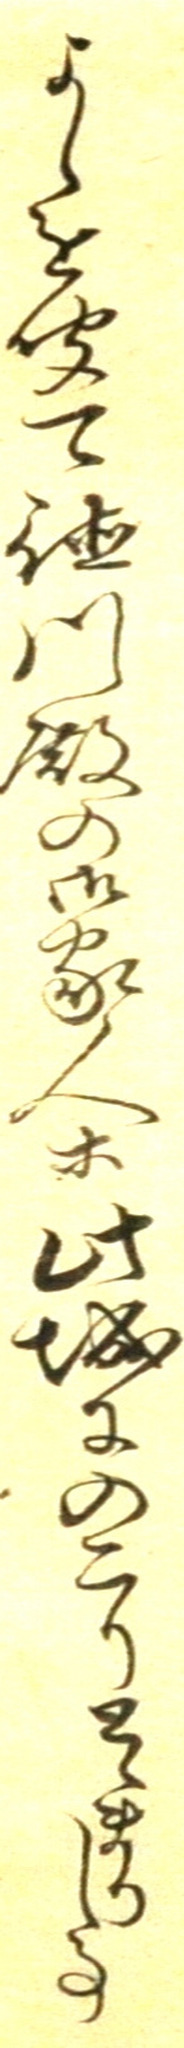よしを聞て徳川殿の御家人等此城にのこりとゝまりし事
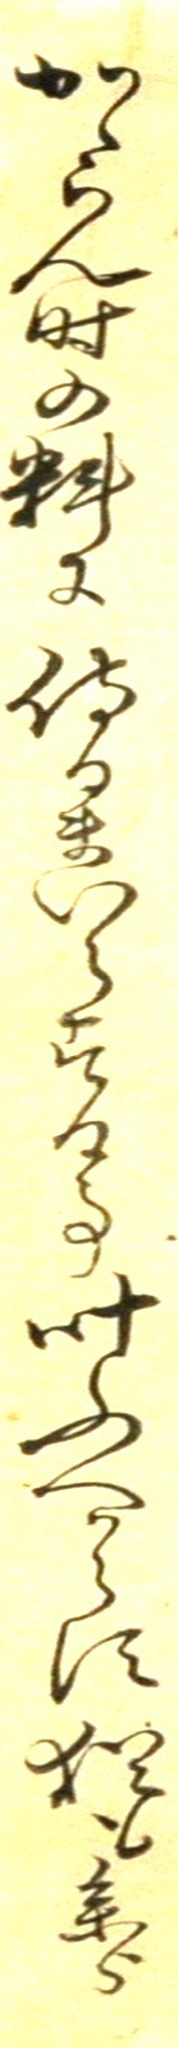かゝらん時の料に侍るまいらする事叶ふへからす猶も参ら

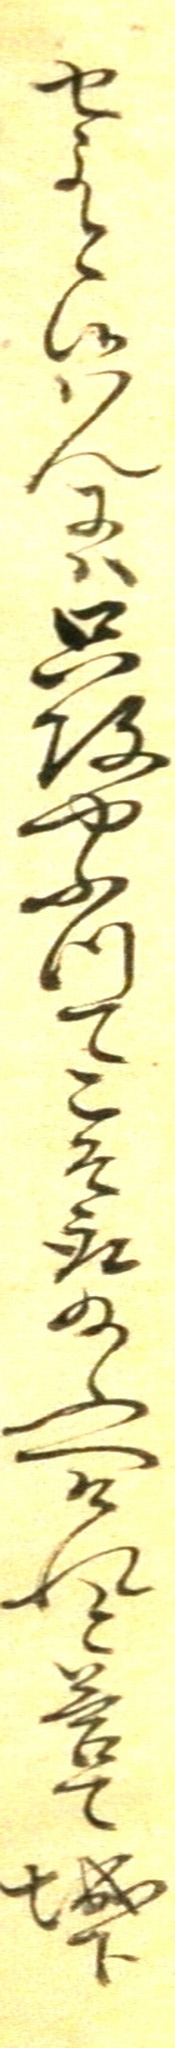せよと候はんには只攻めやふつてこそ取給ふへけれと答て城下
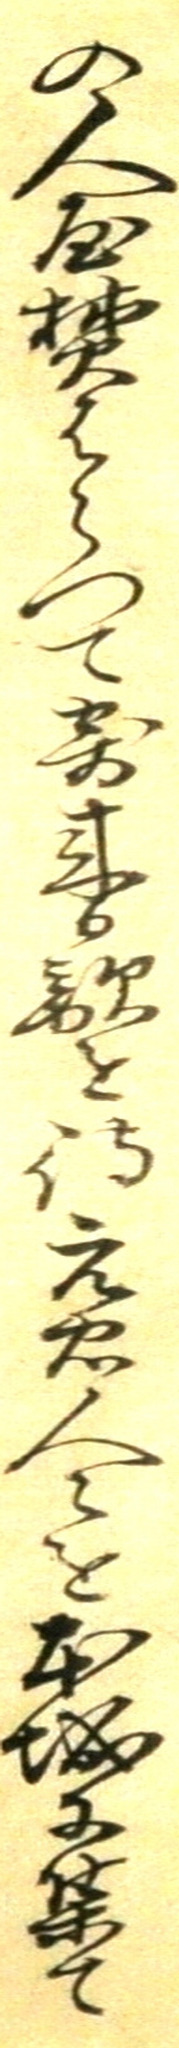の人屋焚はらつて寄来る敵を待元忠人々を本城に集て
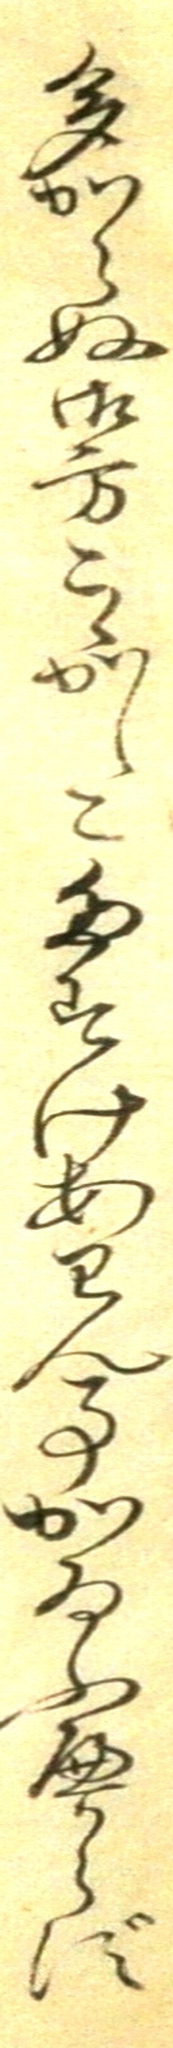多からぬ御方こゝかしこたすけあわん事かなふへからず
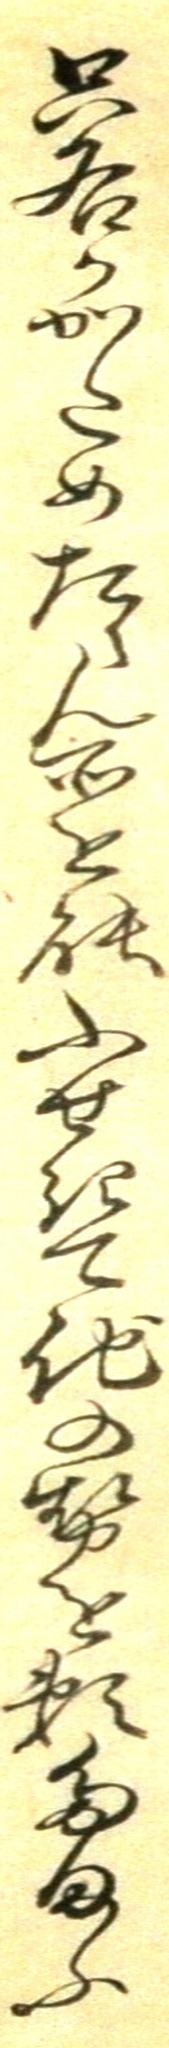只各かかためたらん所を能ふせきて他の勢を頼たまふ
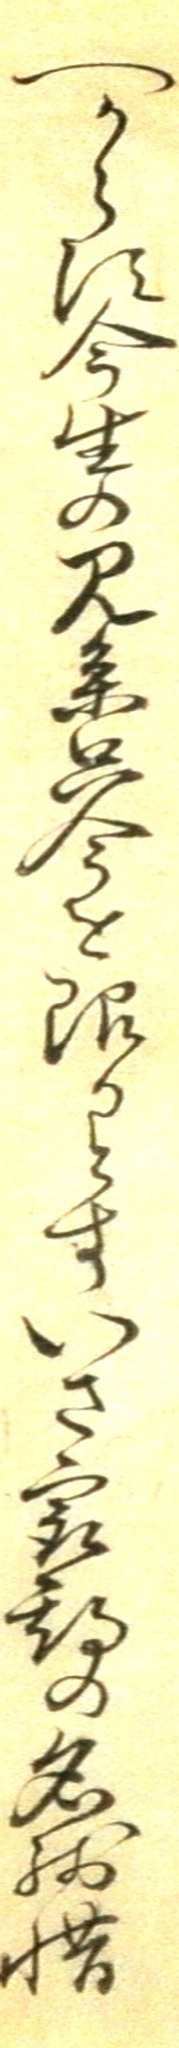へからす今生の見参只今を限りとすいさ最期の名残惜
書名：藩翰譜（四・中）
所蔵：伊那市立高遠町図書館・合同会社AMANE
